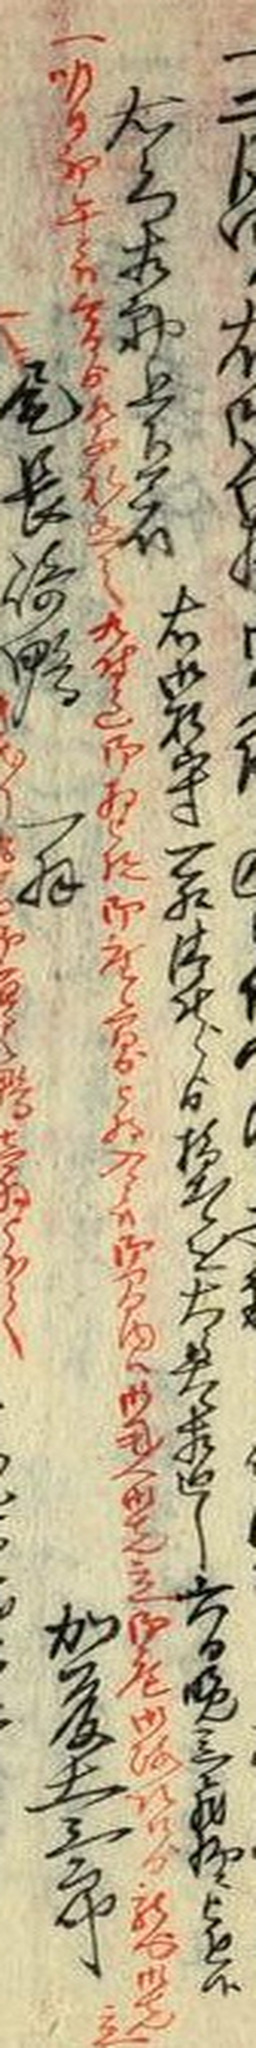尾長崎鴨一羽加藤土三郎
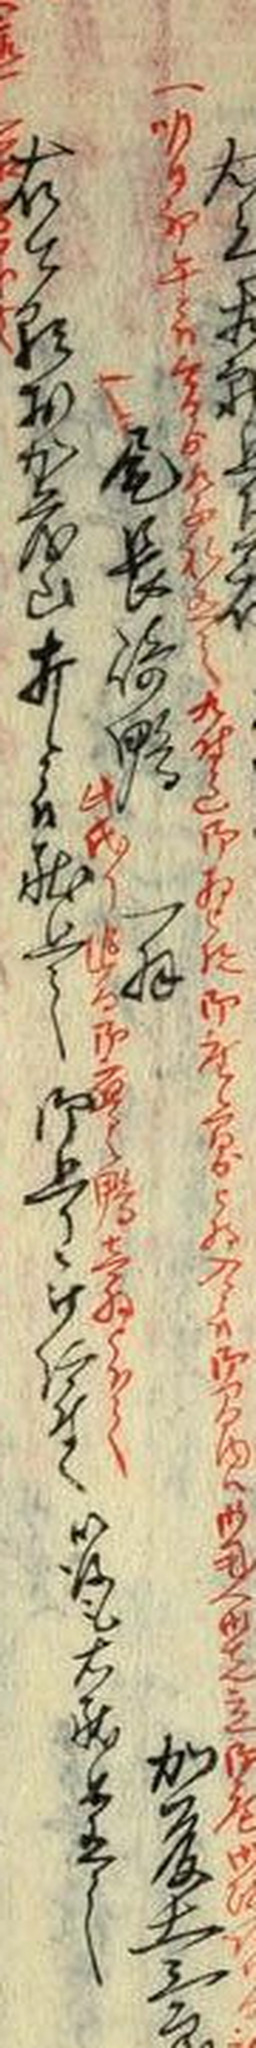右今朝於加茂山打候ニ付献上之御上りニ被仰付候以後も右献上有之
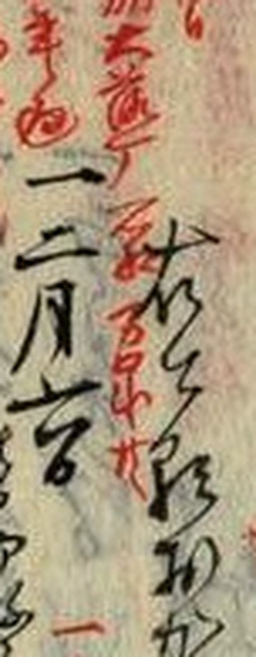一二月六日
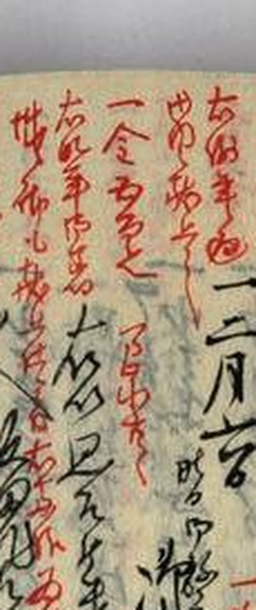一金五百疋万歳共へ
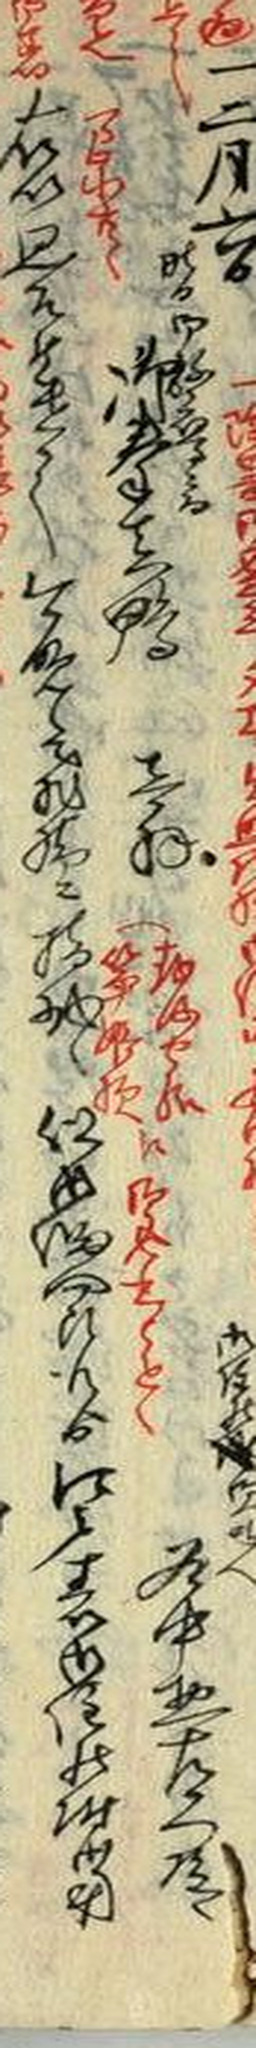右以思召被遣之今晩之飛脚ニ指越候但御側向頭取ゟ江戸表御住居附御用
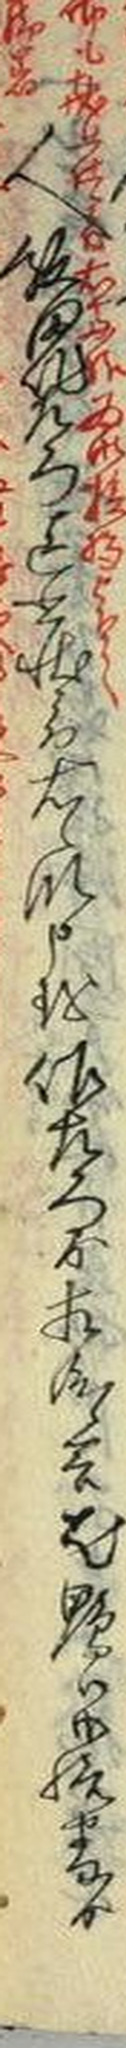人飯田作左衛門迄書状ニ而右之段申越作左衛門ゟ相渡候筈尤鴨ハ御膳番ゟ
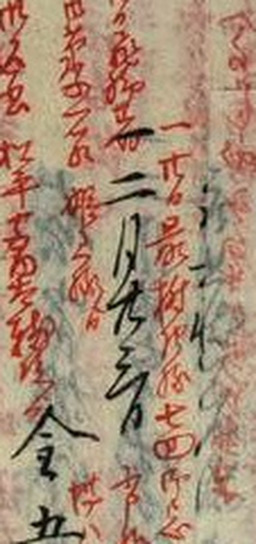一二月六日

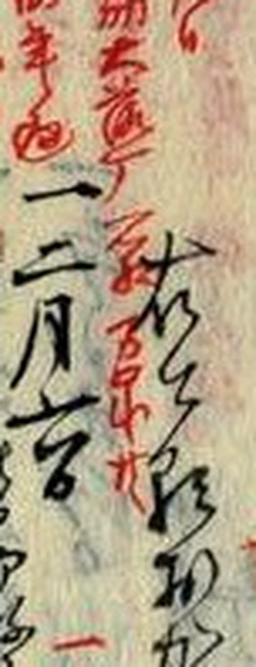一二月十六日
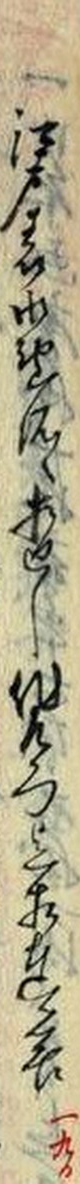江戸表御台所へ相廻し作左衛門迄相達候筈
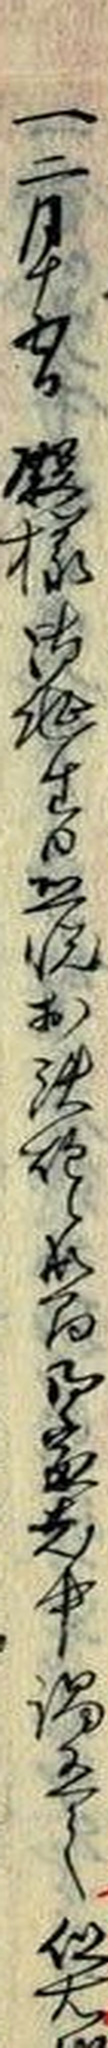一二月十五日殿様御誕生日恐悦於鉄炮之御間御家老中謁有之但右謁
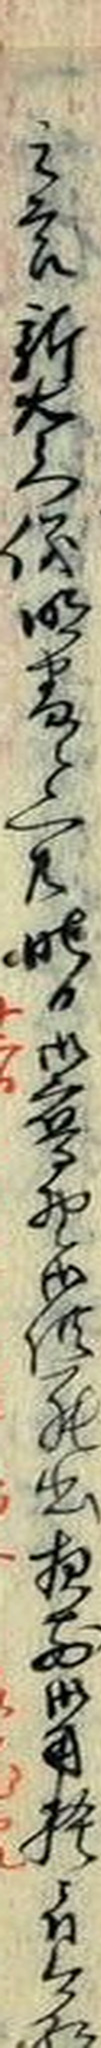之節新右衛門儀明番ニ候ヘ共昨日御鷹野御供罷出夜前御用捨ニ付今朝御
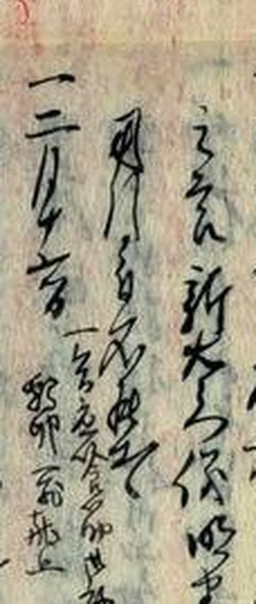用引ニ付不罷出候
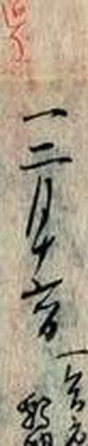一二月十六日
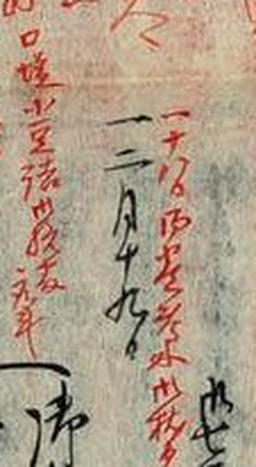一二月十九日
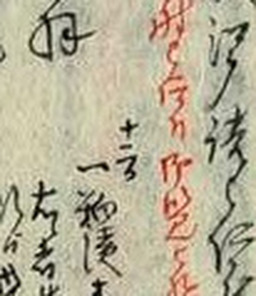十二日
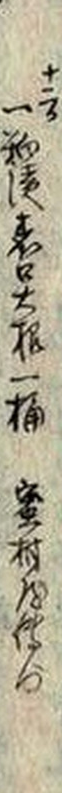一粕漬森口大根一桶蜜柑屋伝右衛門
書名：少傅日録抄（斉承付側向頭取日記、在国）
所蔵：福井県文書館 Fukui Prefectural Archives
